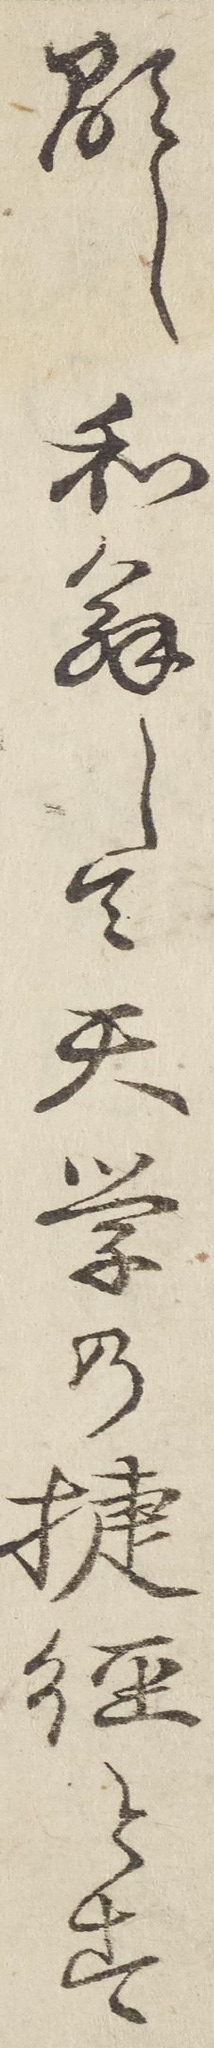顕し和解して天学の捷径とす
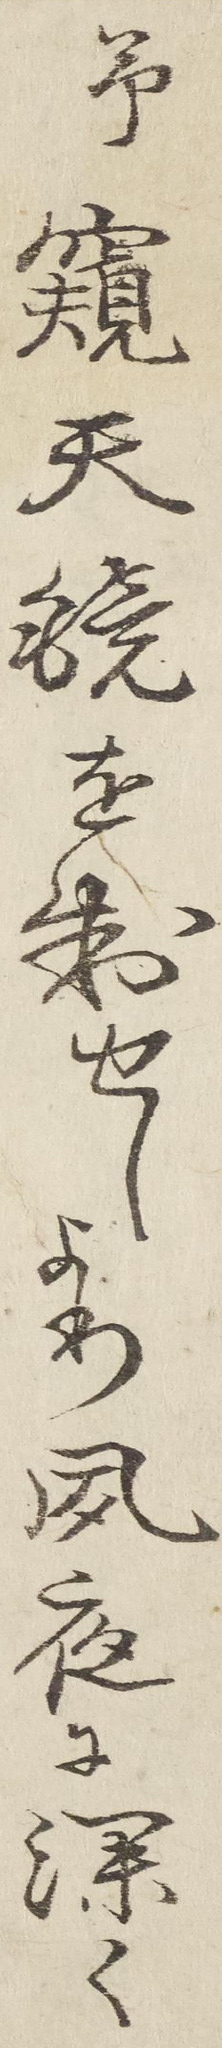予窺天鏡を成せしより夙夜に深く
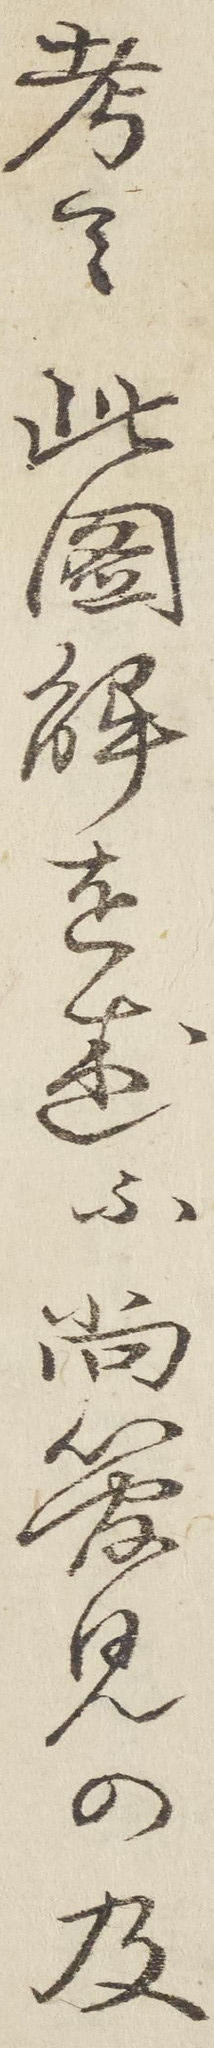考て此図解を述ふ尚管見の及
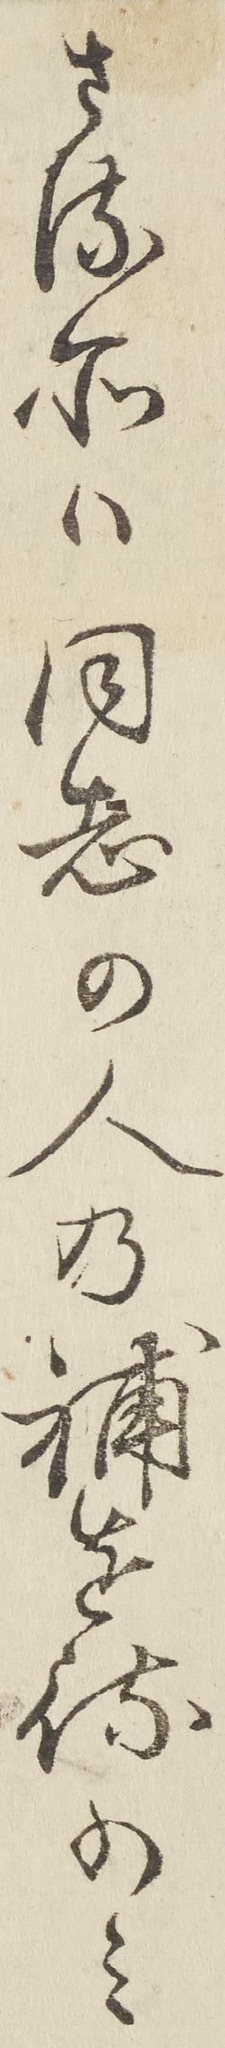さる所は同志の人の補を待のみ
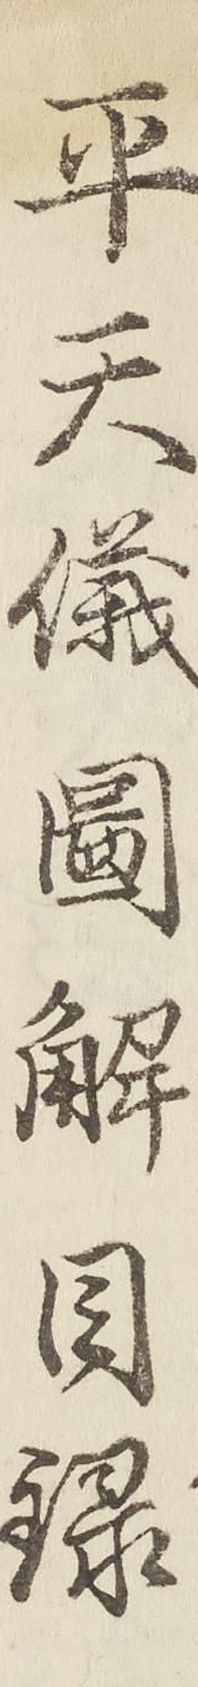平天儀図解目録
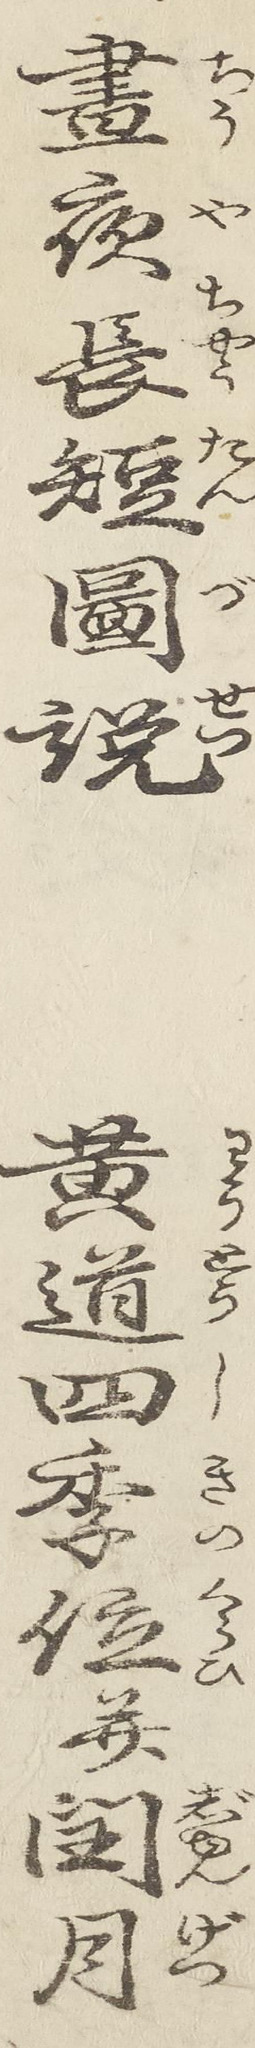昼夜長短図説黄道四季位幷閏月

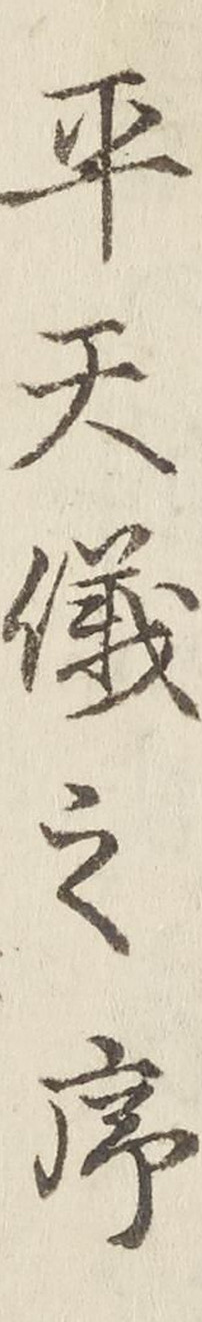平天儀之序
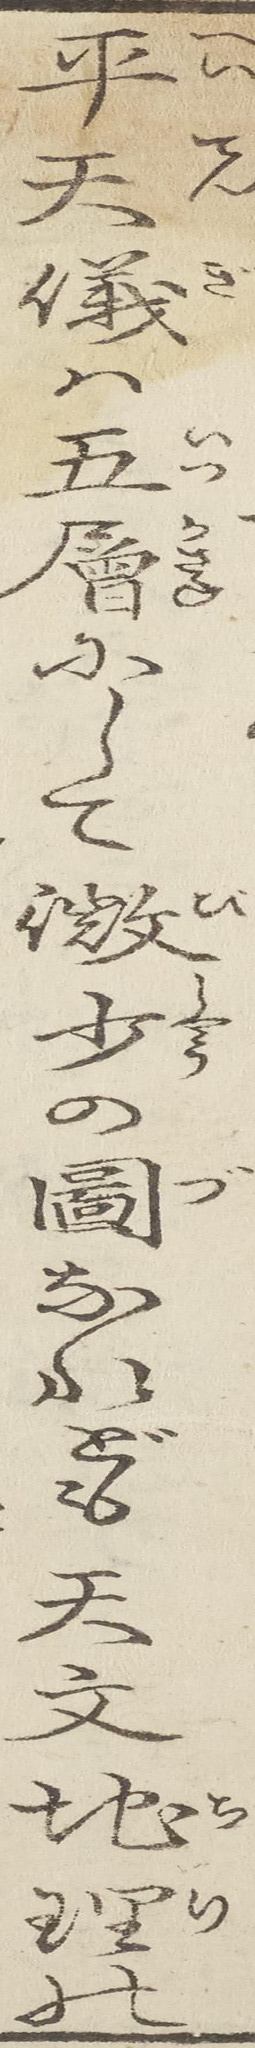平天儀は五層にして微少の図なれども天文地理の
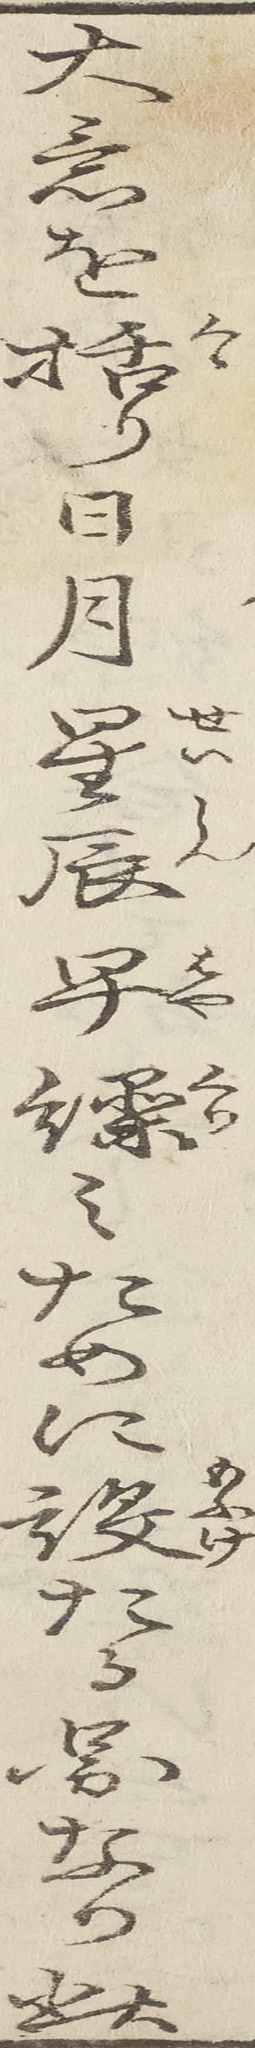大意を括り日月星辰早繰之ために設たる図なり此
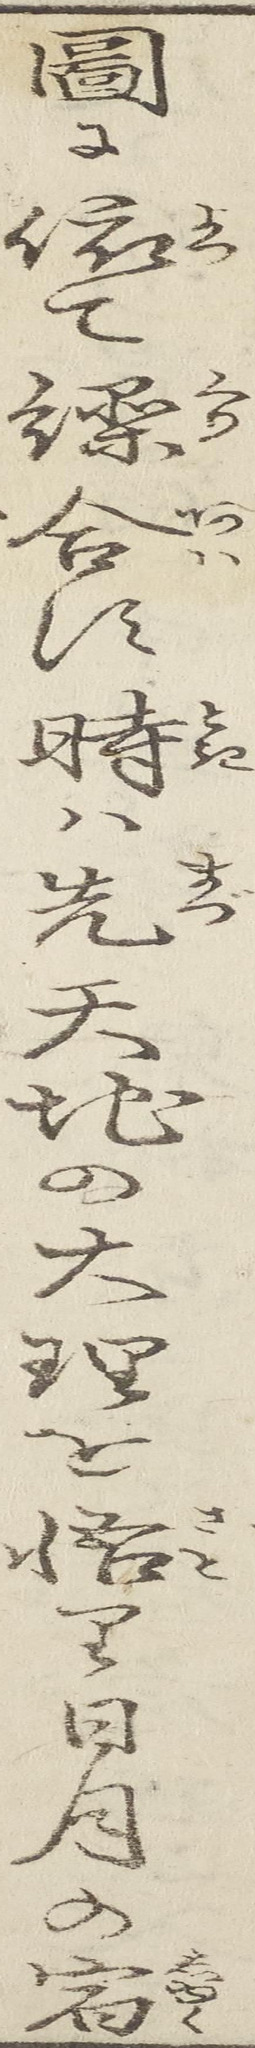図に依て繰合す時は先天地の大理を悟り日月の宿
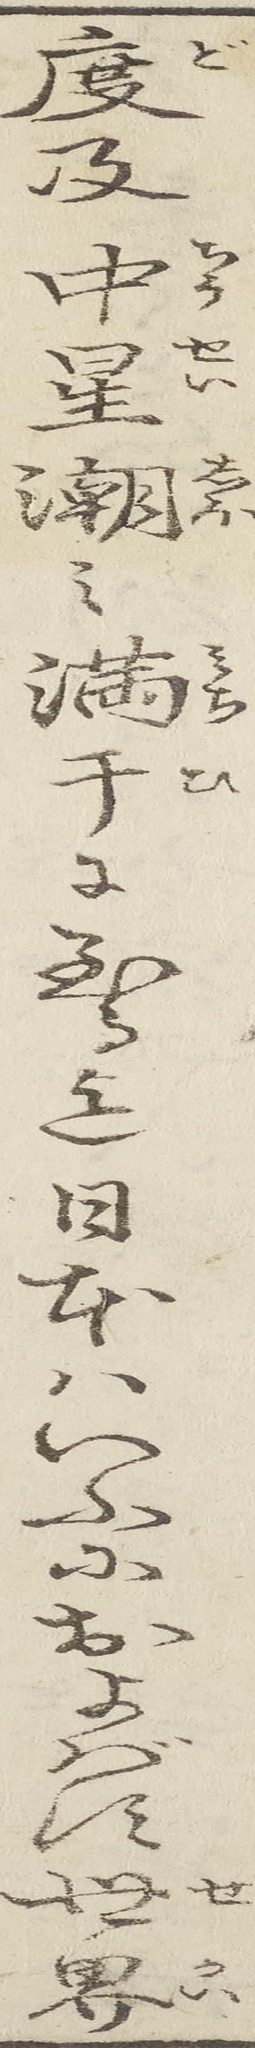度及中星潮之満干に至る迄日本はいふにおよばす世界
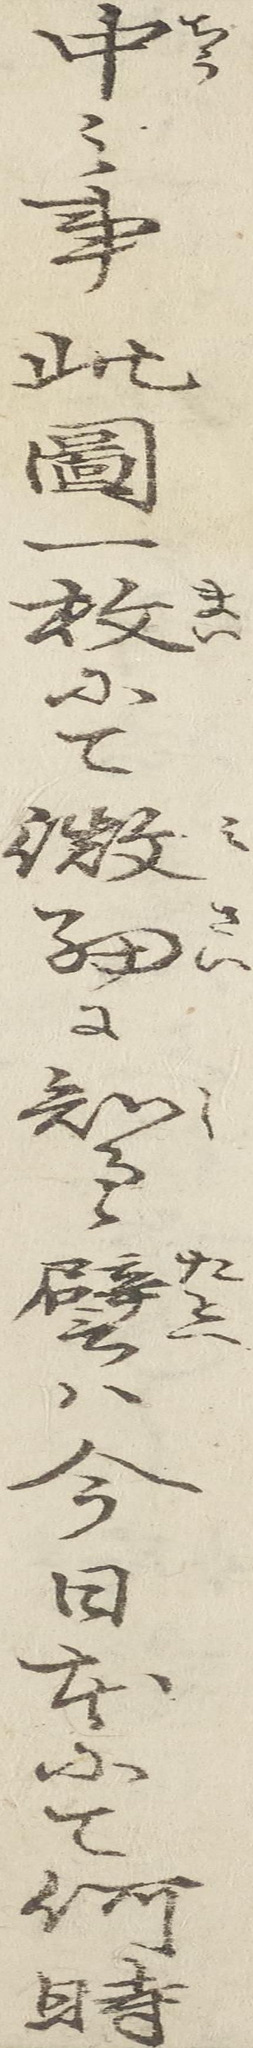中之事此図一枚にて微細に知るゝ譬は今日本にて何時
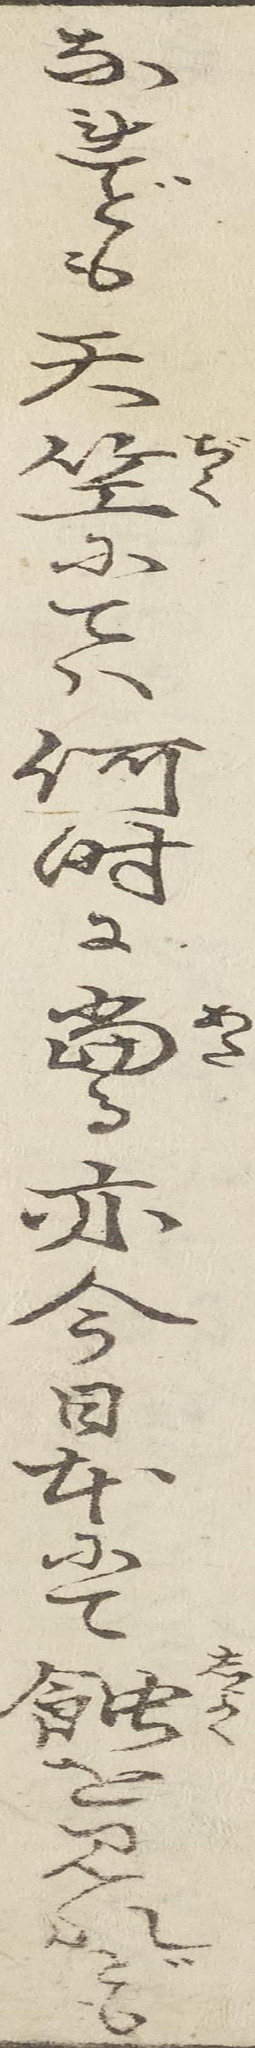なれども天竺にては何時に当る亦今日本にて蝕を見れども
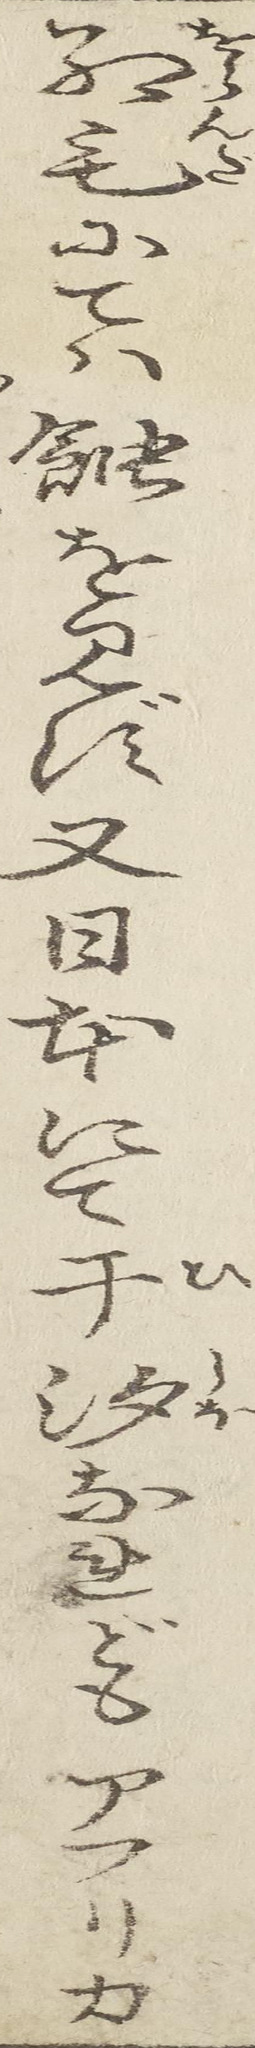紅毛にては蝕を見ず又日本にて干汐なれどもアフリカ
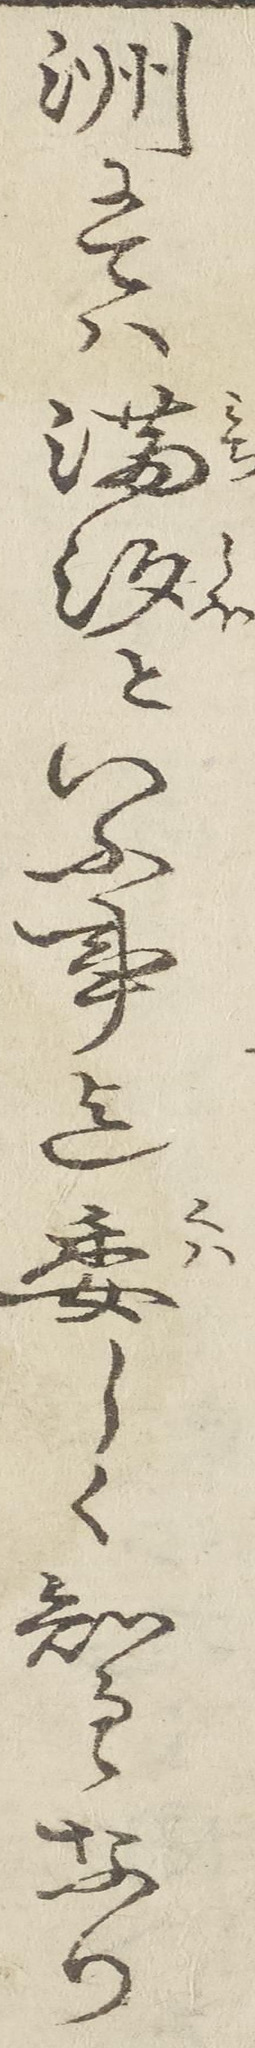州にては満汐といふ事迄委しく知るゝなり

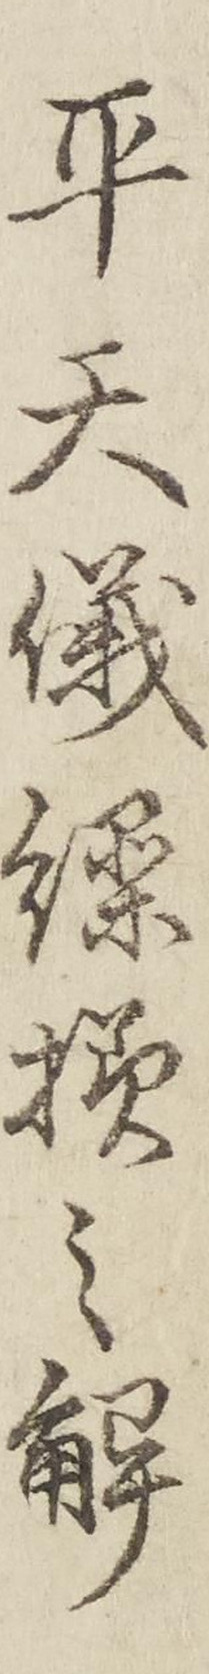平天儀繰様之解
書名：平天儀圖解
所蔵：東京大学地震研究所図書室 Earthquake Research Institute Library, The University of Tokyo, JAPAN
